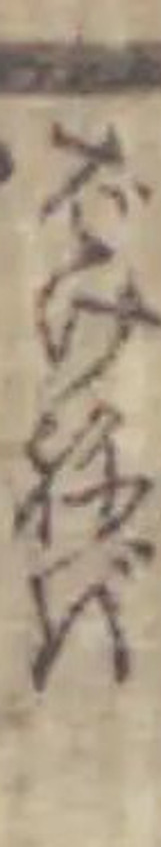ばけねば
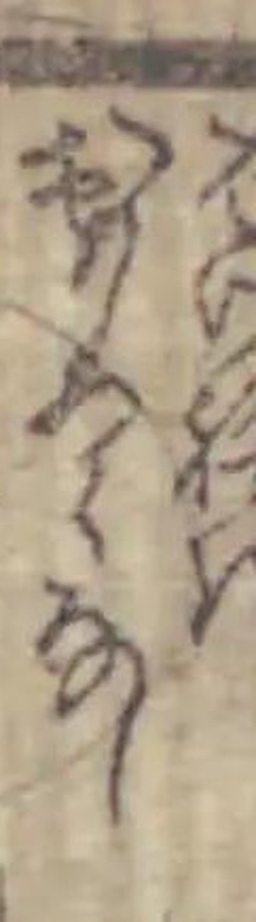おもしろくなし
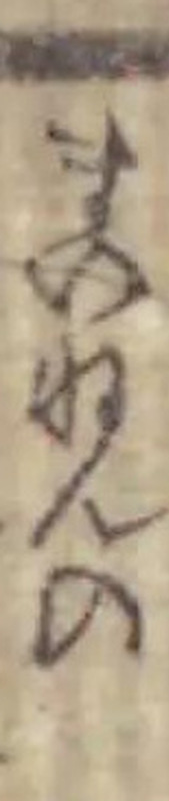まいねんの
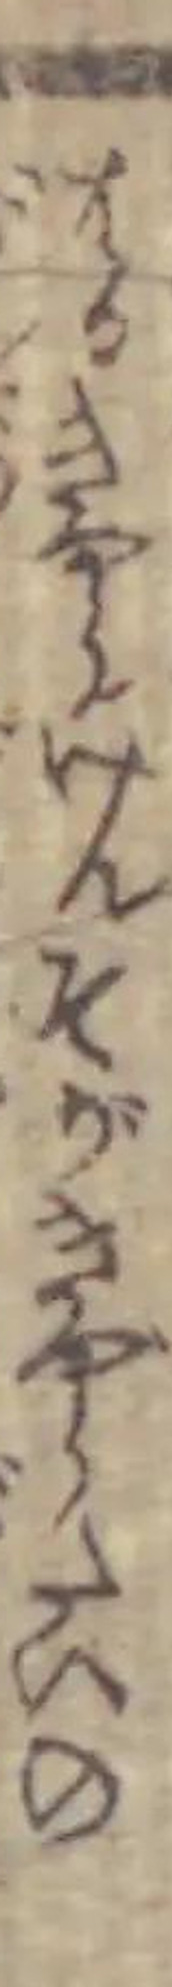はるきやうけんそがきやうたいの
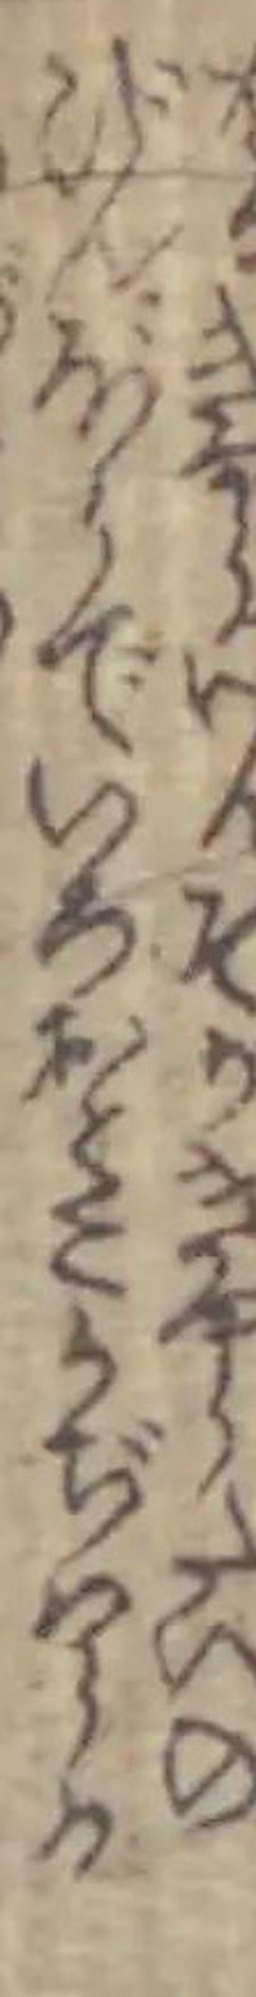びんぼうでいろおとこかぢはらか
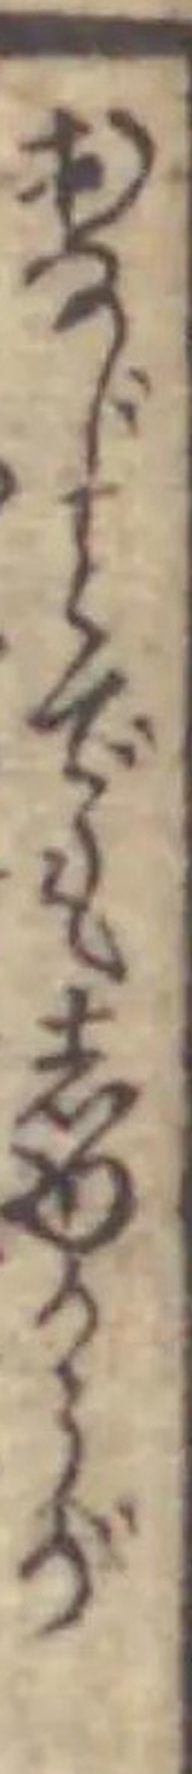おなじことでもしゆかうが
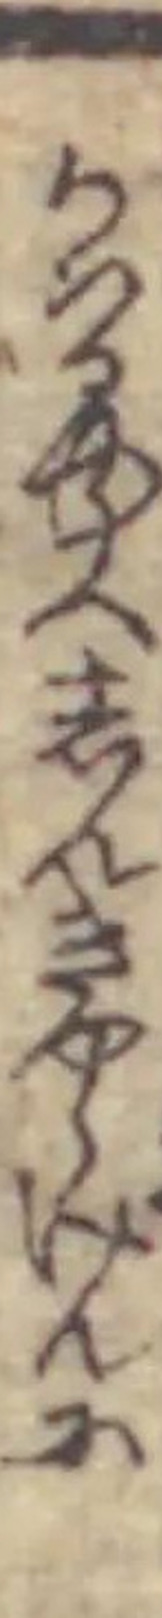かはるゆへしんきやうけんに
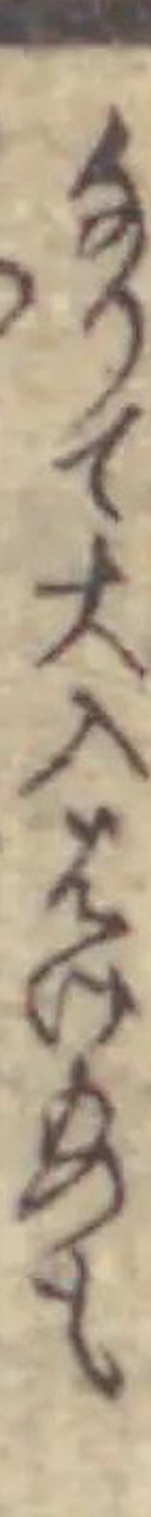なりて大入ばけものも
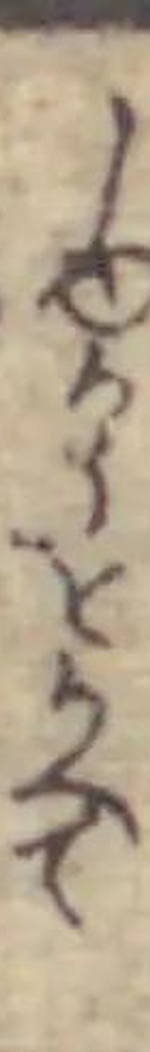しゆかうをかへて
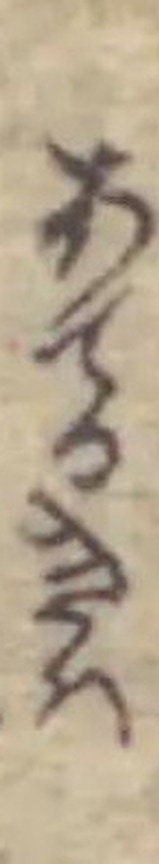あてるきは

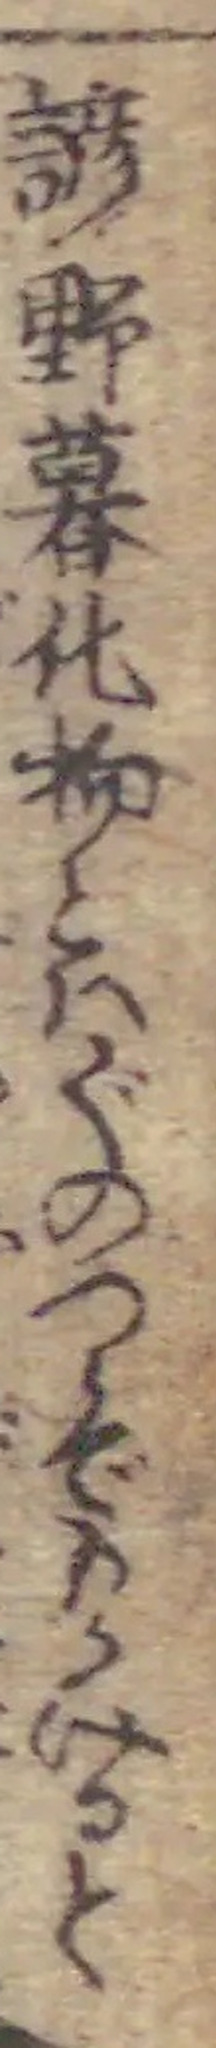諺野暮化物とはぐのつらでもかけると
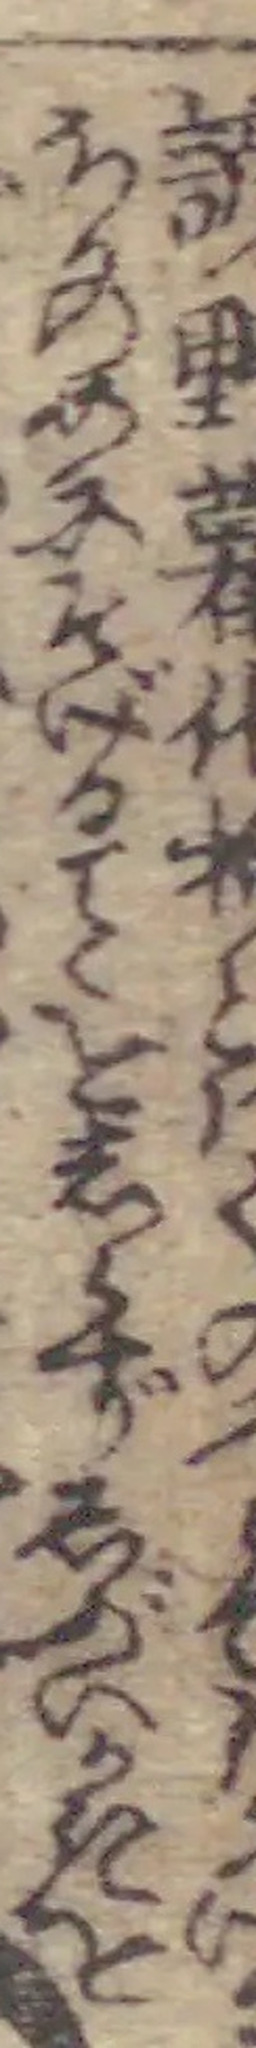ほりのめにそげることをしらずしぶいかきを
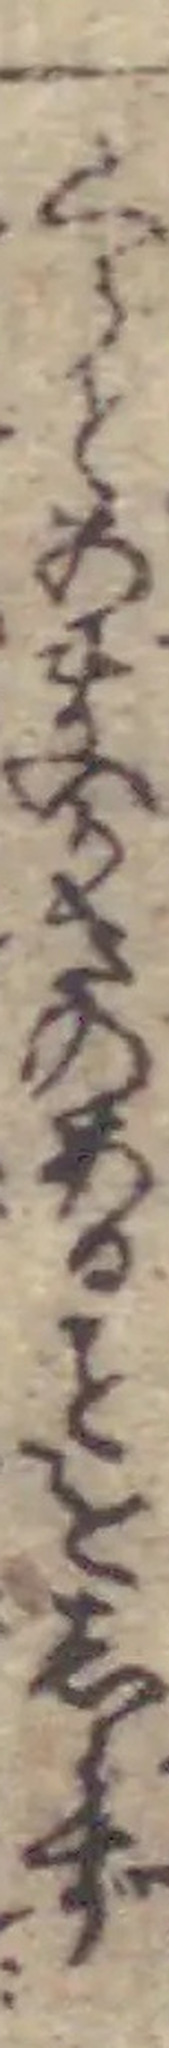くうとあまいかきのあることをしらず
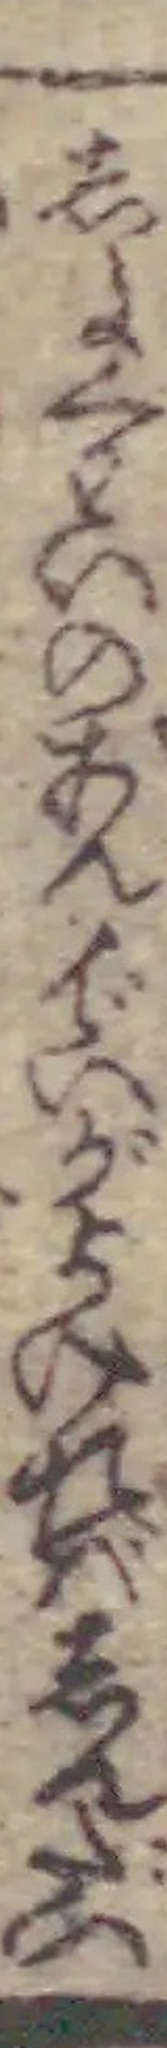しよくわいのあんばいがよければしんだい
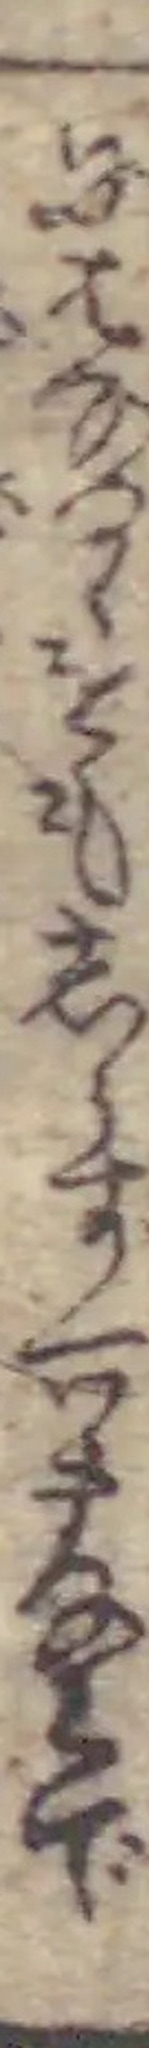にはなるゝをもしらず一つまなこで
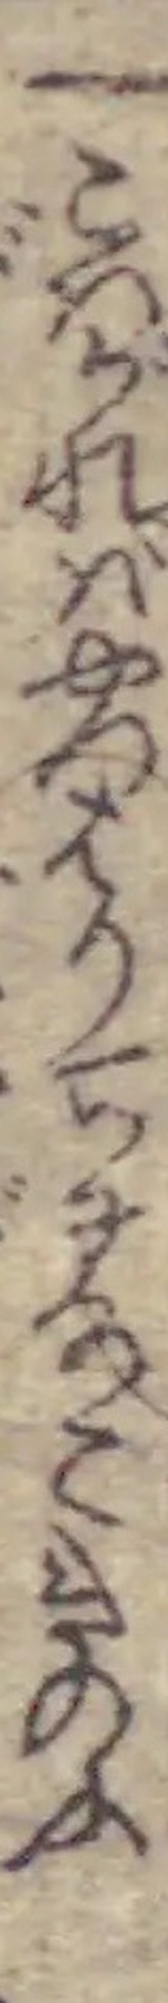こはがればやつはり一つまなこきのふ
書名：化物昼寝鼾 2巻
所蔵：国立国会図書館 National Diet Library, JAPAN
